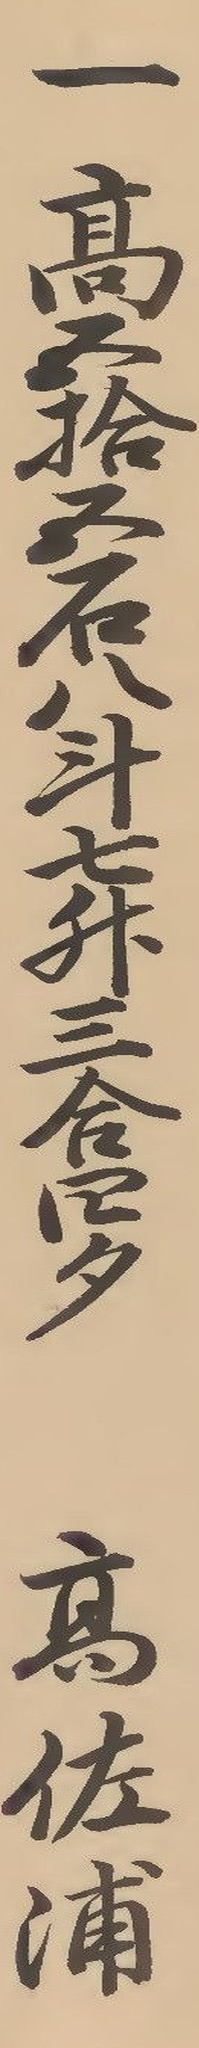一高五拾五石八斗七升三合四勺高佐浦
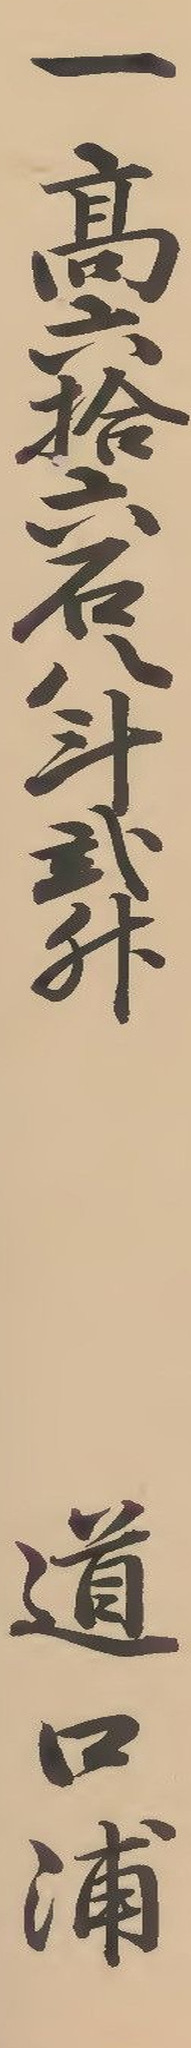一高六拾六石八斗弐升道口浦
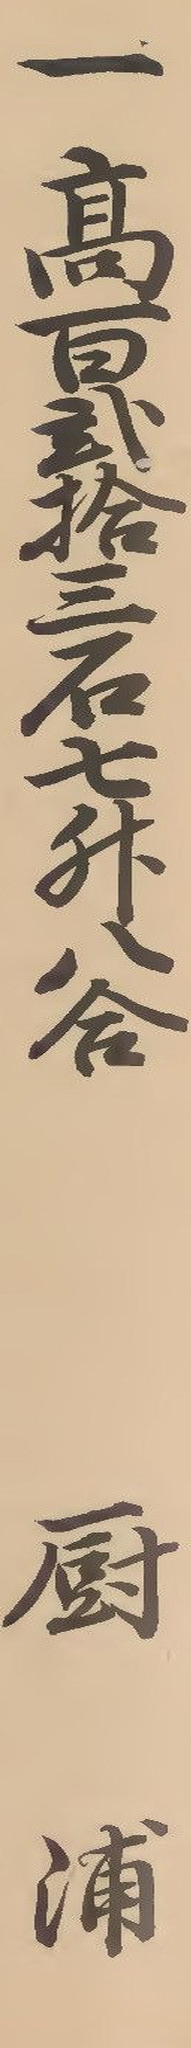一高百弐拾三石七升八合厨浦
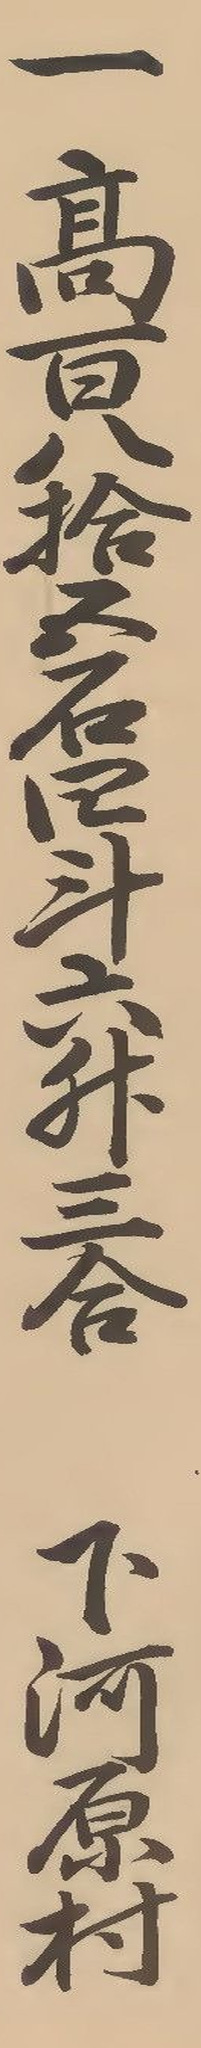一高百八拾五石四斗六升三合下河原村
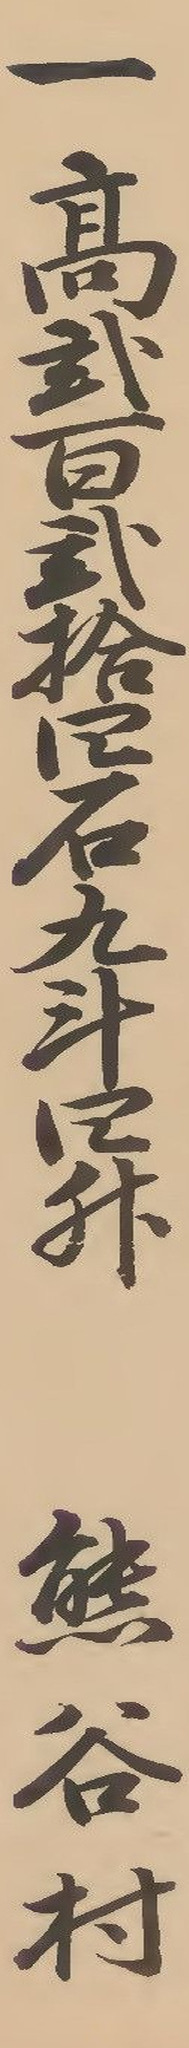一高弐百弐拾四石九斗四升熊谷村

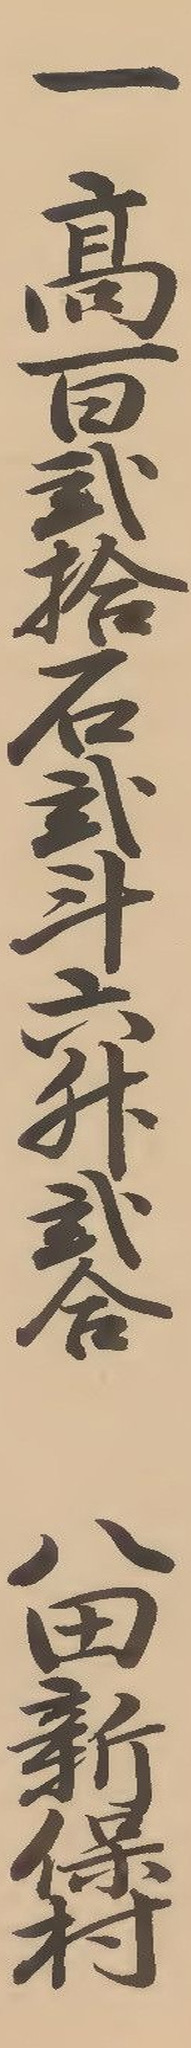一高百弐拾石弐斗六升弐合八田新保村
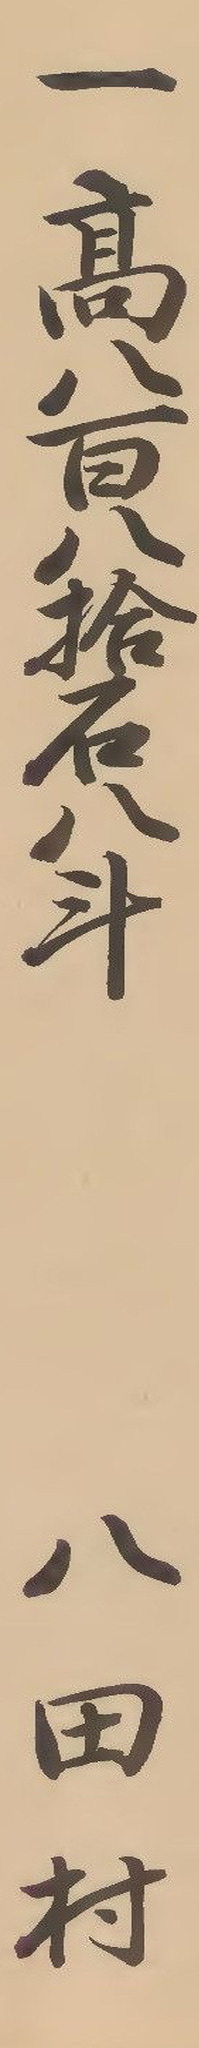一高八百八拾石八斗八田村
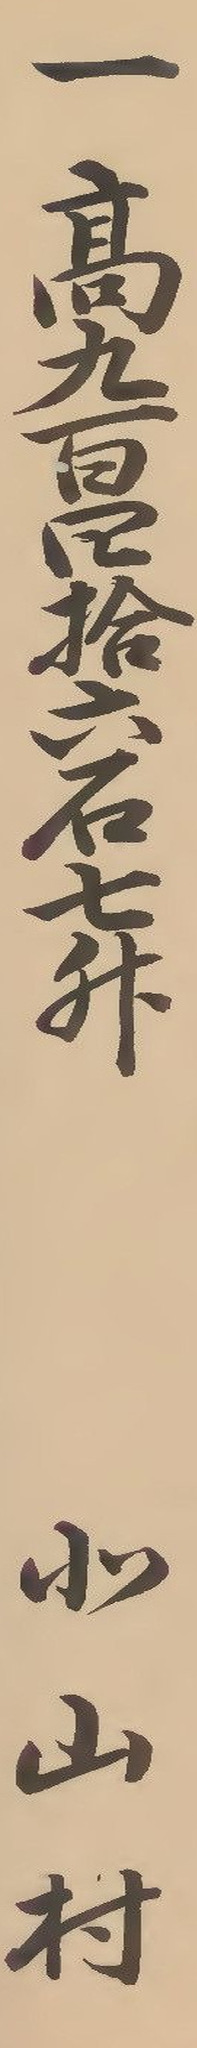一高九百四拾六石七升北山村
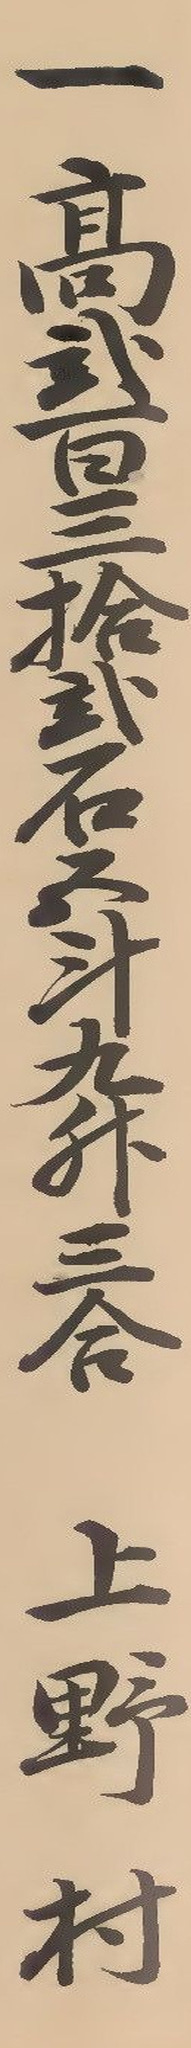一高弐百三拾弐石五斗九升三合上野村
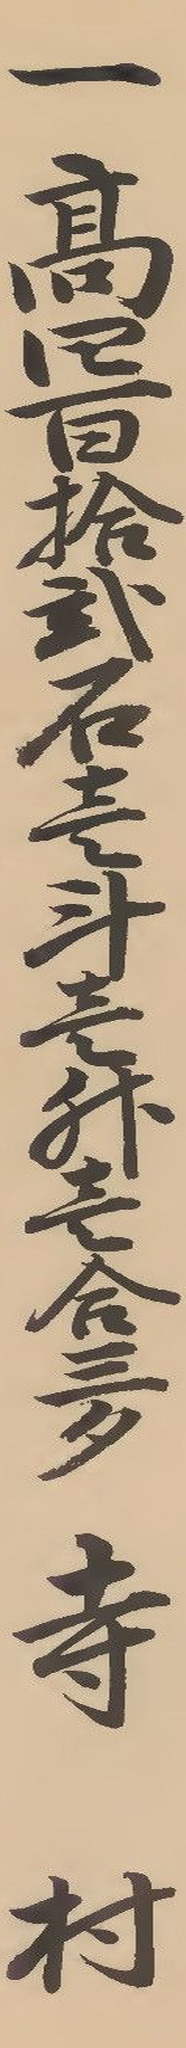一高四百拾弐石壱斗壱升壱合三勺寺村

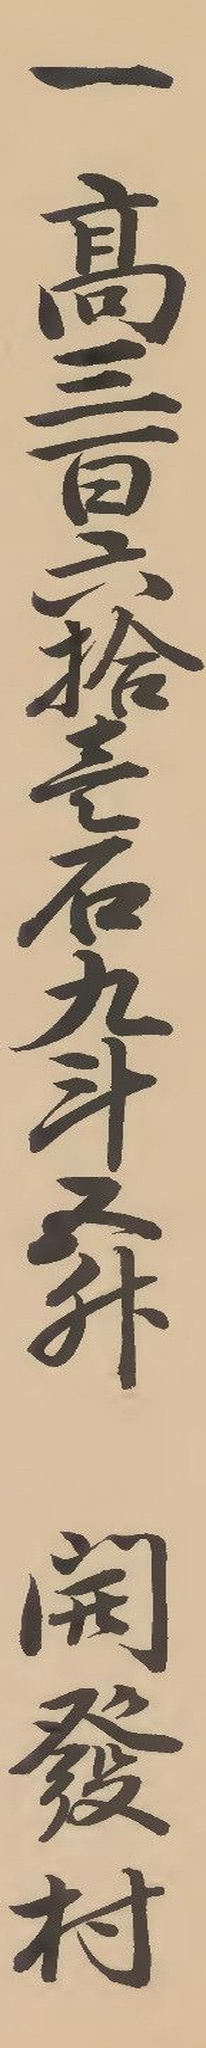一高三百六拾壱石九斗五升開発村
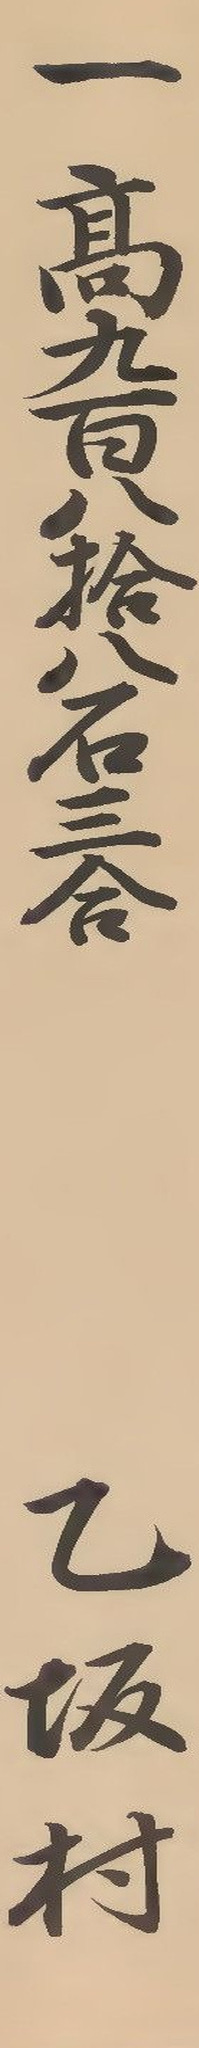一高九百八拾八石三合乙坂村
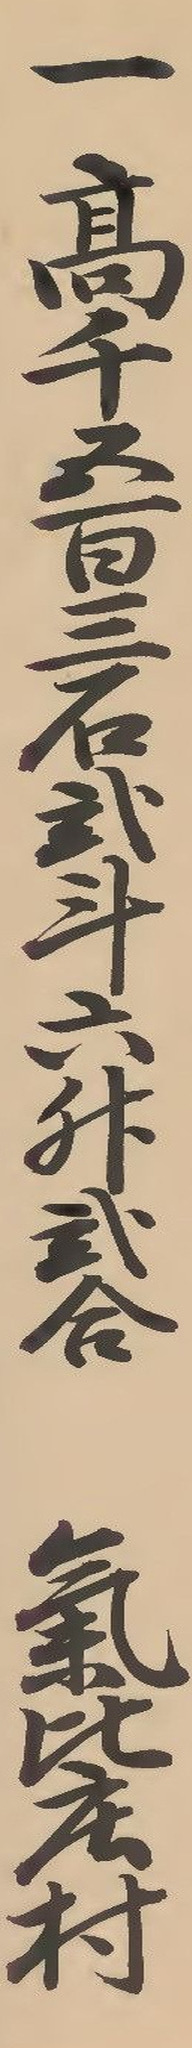一高千五百三石弐斗六升弐合気比庄村
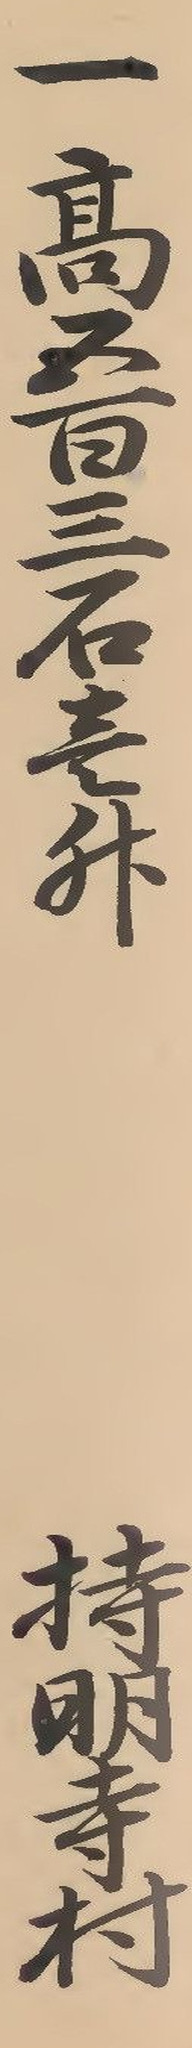一高五百三石壱升持明寺村
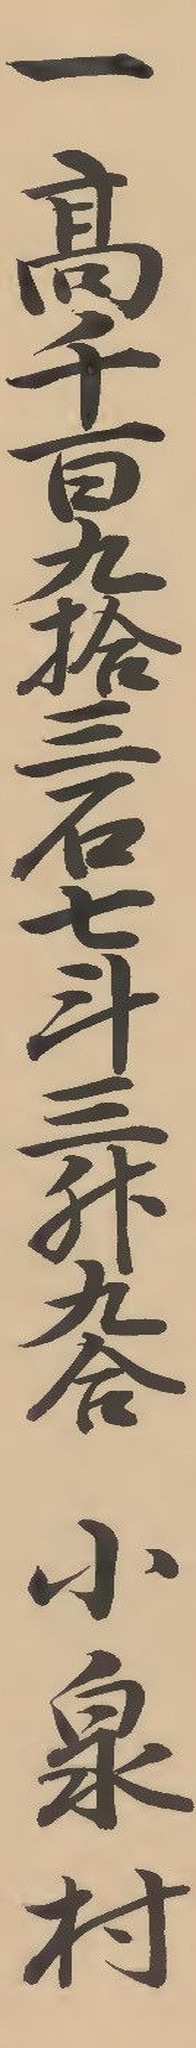一高千百九拾三石七斗三升九合小泉村
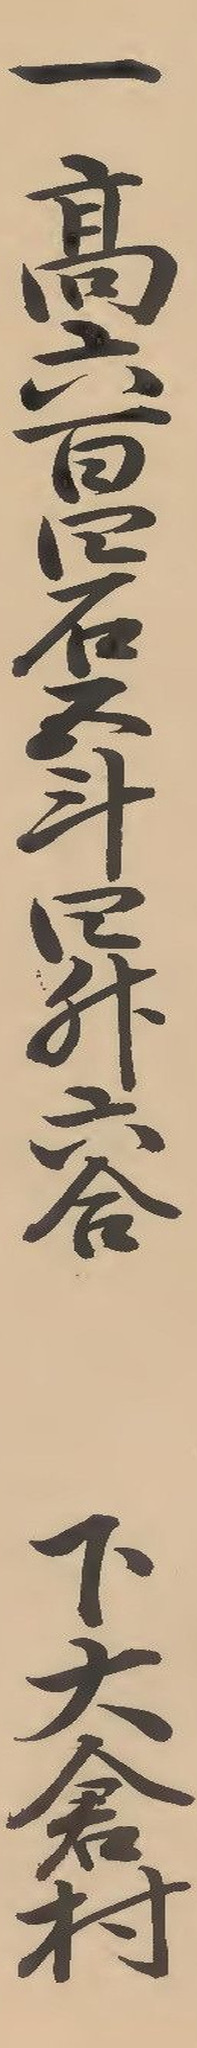一高六百四石五斗四升六合下大倉村
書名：越前国郷帳
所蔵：国立公文書館 National Archives of Japan
